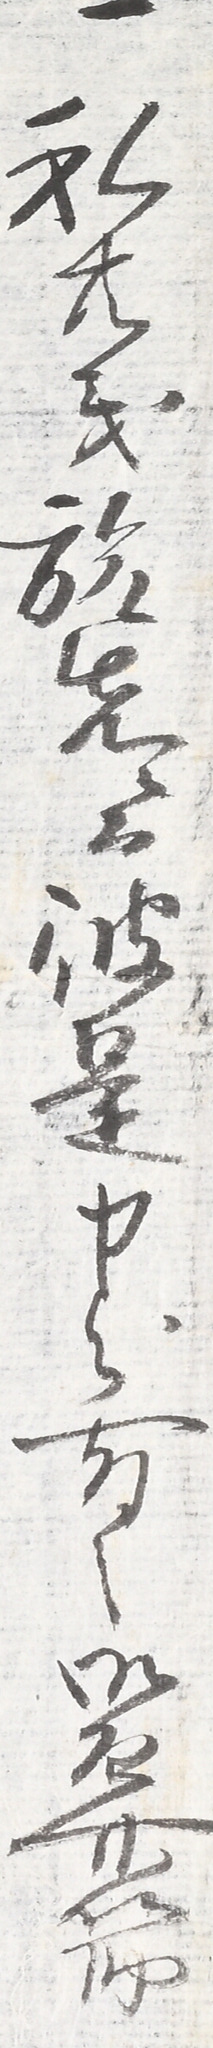一私共義旅先ニ而彼是申分有之御厄介筋
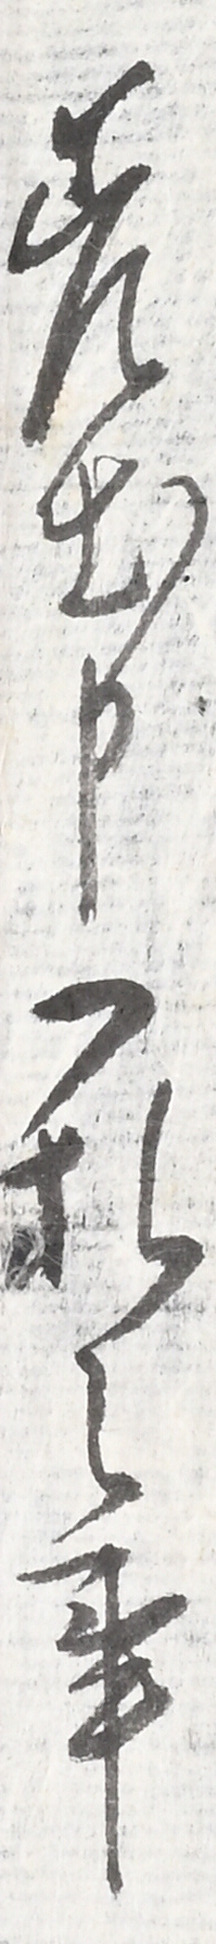差出申一札之事
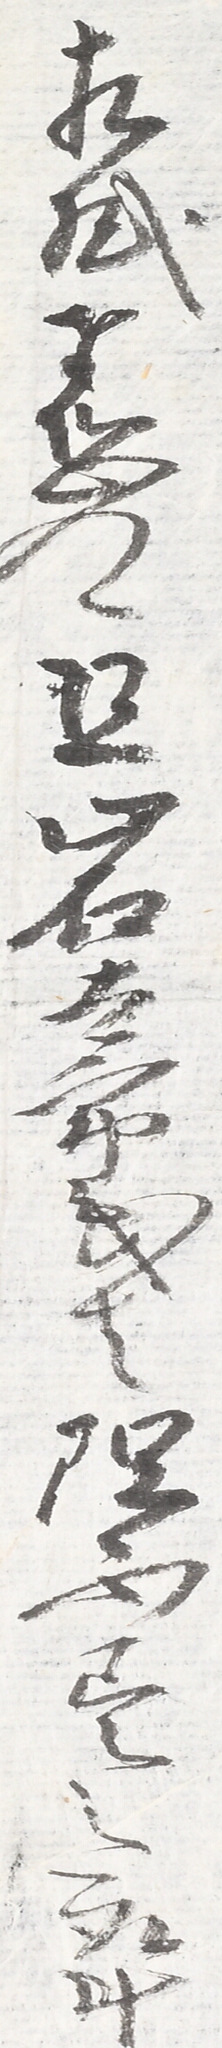相掛奉恐入候且岩太郎義者理不尽之取斗
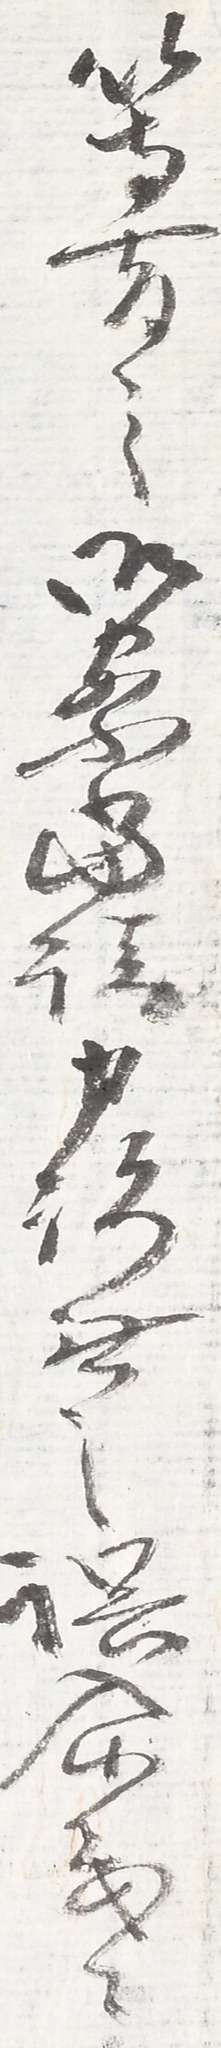等有之御察当請申談無之誤入候義ニ
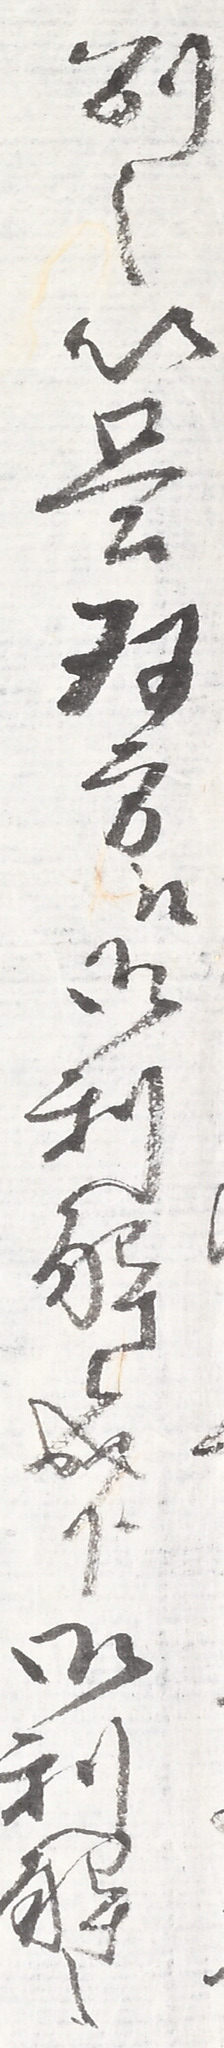別之以口合双方江御利解被成下御利解之
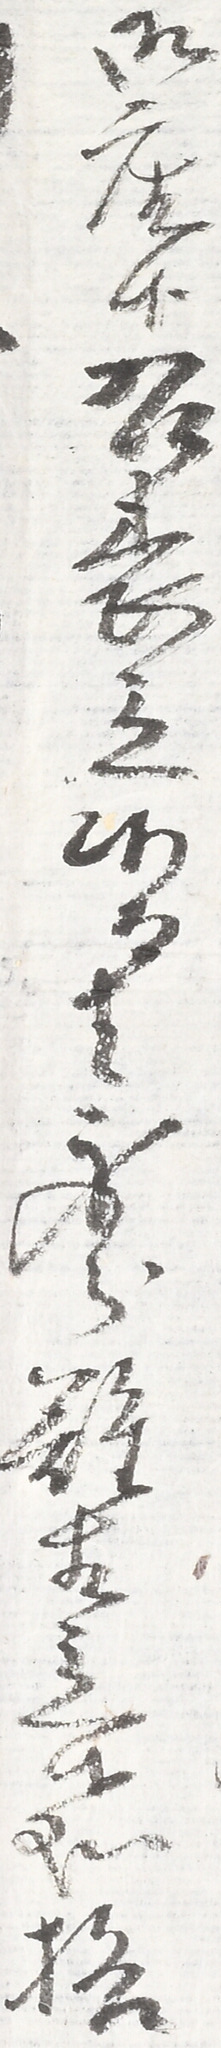御座候右表立候而者身分難相立候処格
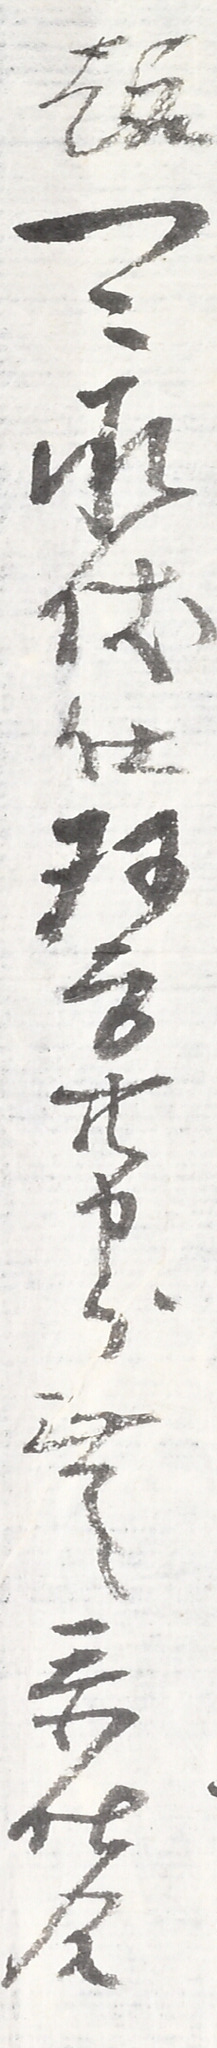趣可承伏仕双方共申分無之忝仕合
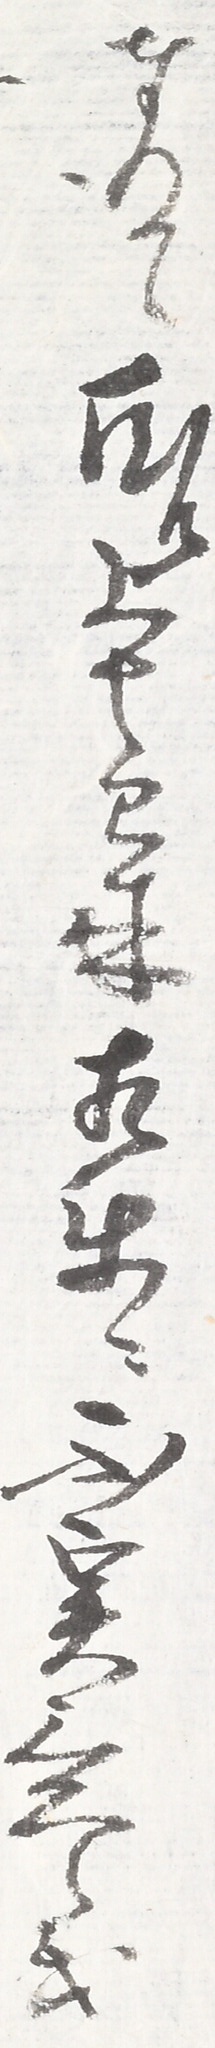奉存候然ル上者已来相互ニ不実意之義
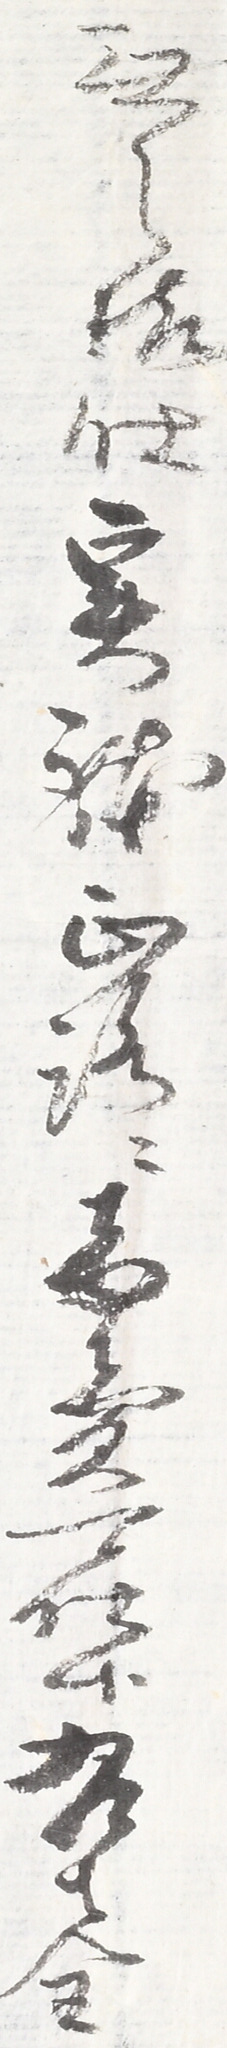無之様仕実躰正路ニ商売可仕候右は全
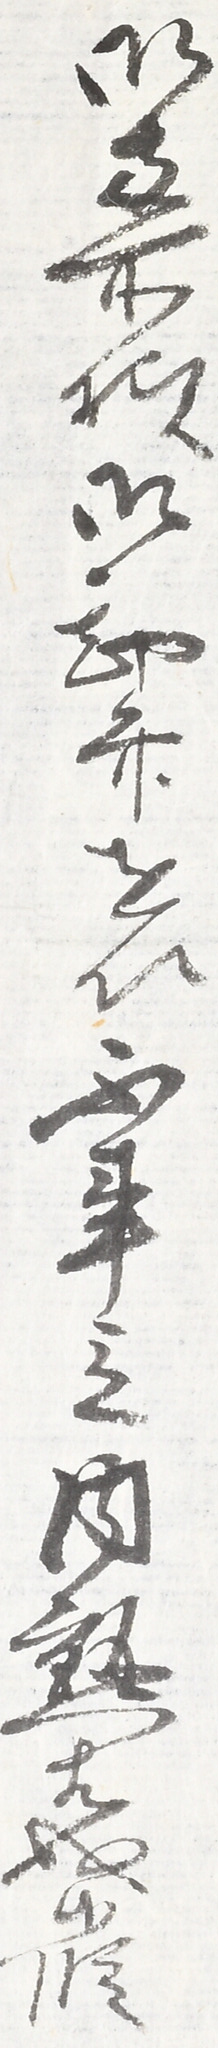御両所様御勘弁を以不事立内熟相成候段
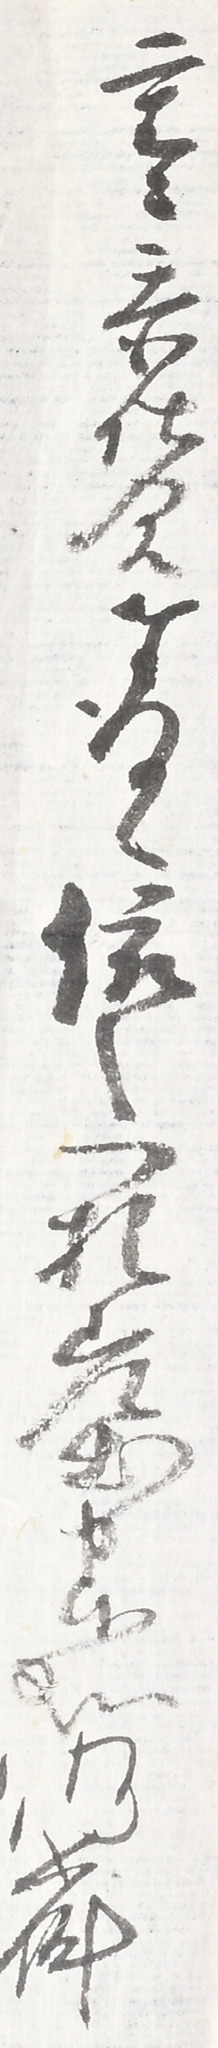重々忝仕合奉存候依之一札差出申候処仍如件
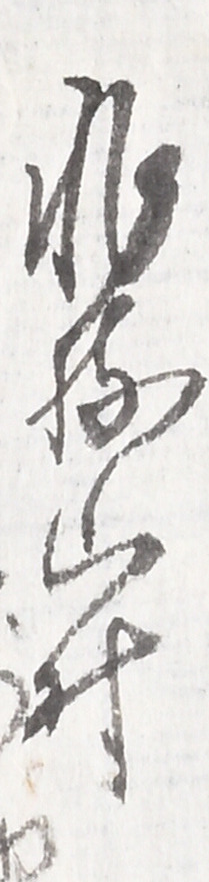非持山村
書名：差出申一札之事
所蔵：伊那市立高遠町図書館・合同会社AMANE
